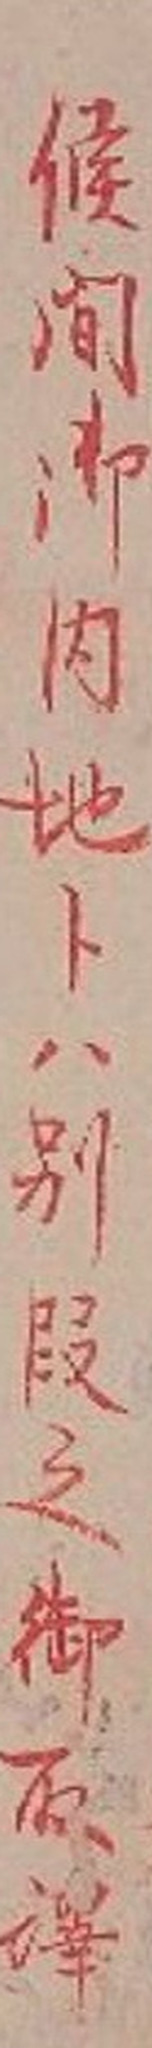候間御内地トハ別段之御取訳
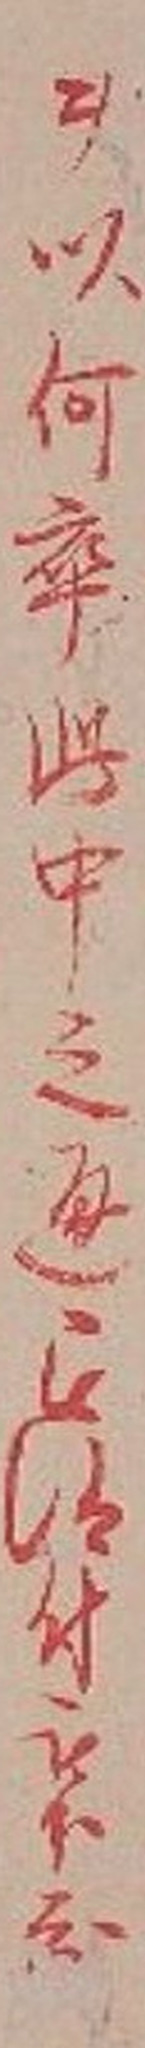ヲ以何卒此中之通被仰付被下度
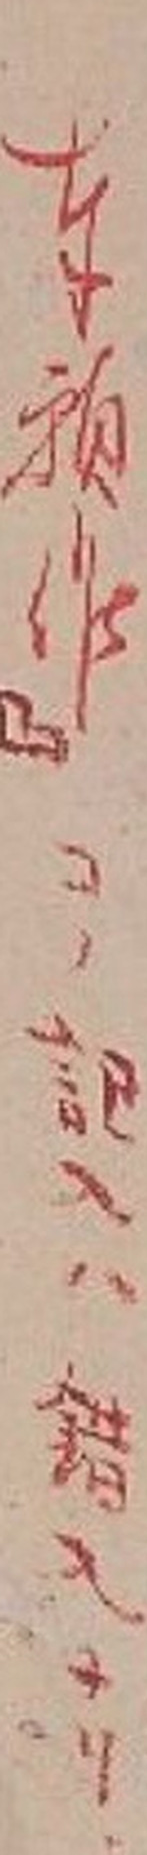奉願候』コノ記入ハ錯入ナリ
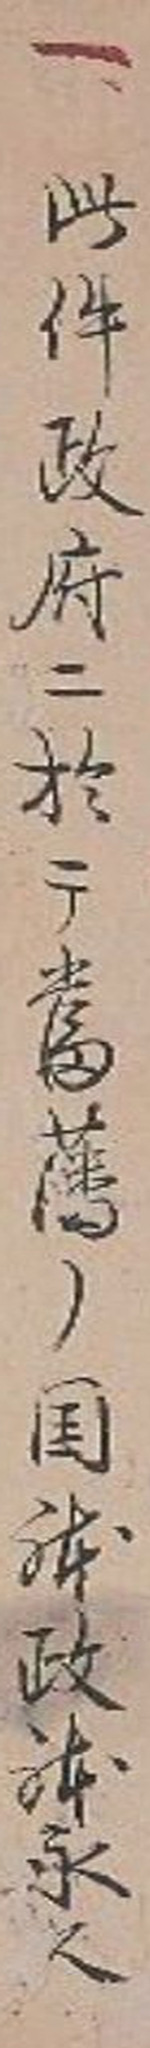一、此件政府ニ於テ当藩ノ国体政体永久
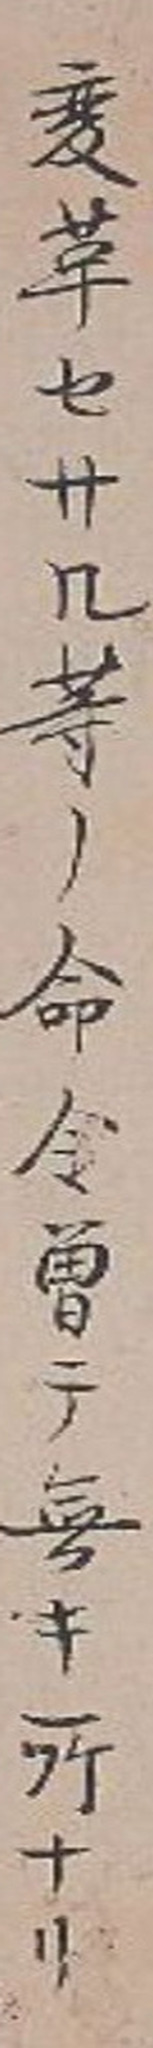変革セサル等ノ命令曽テ無キ所ナリ
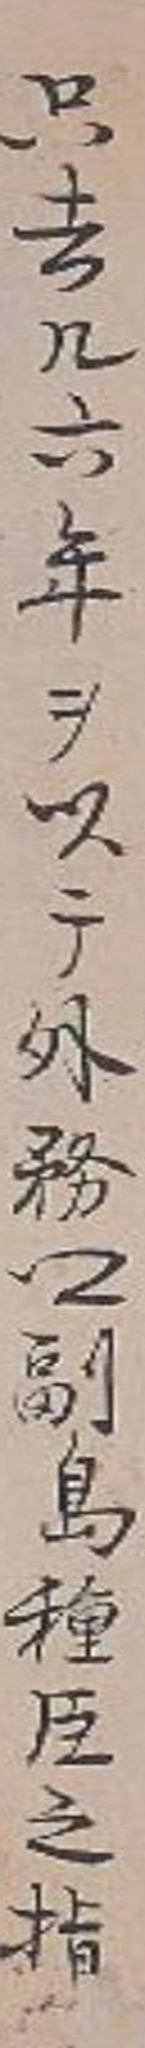只去ル六年ヲ以テ外務卿副島種臣之指
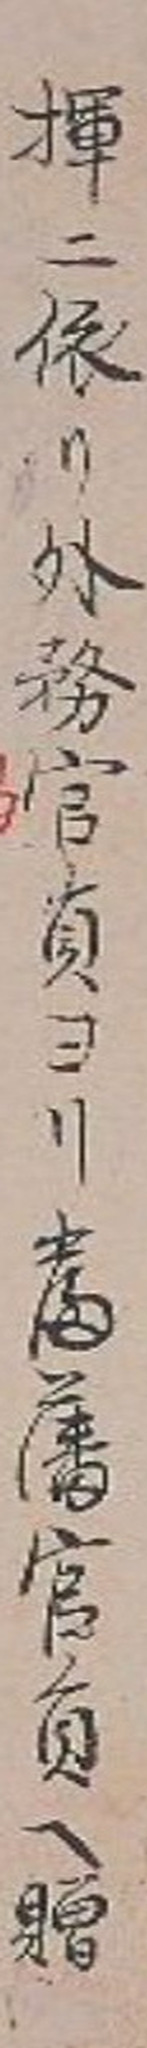揮ニ依リ外務官員ヨリ当藩官員ヘ贈
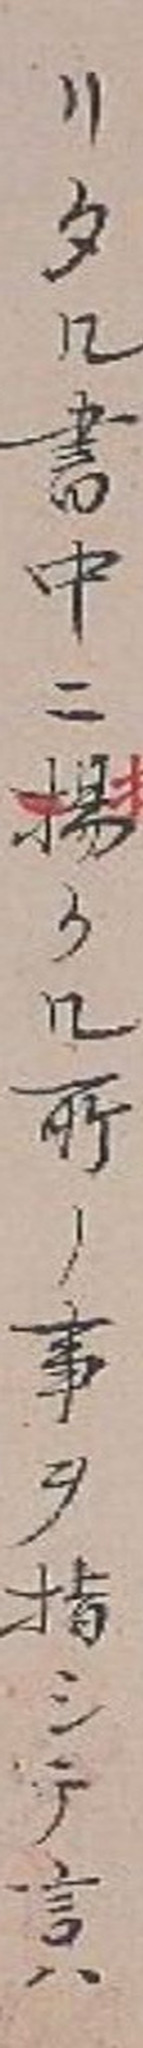リタル書中ニ揚ケル所ノ事ヲ指シテ言ハ
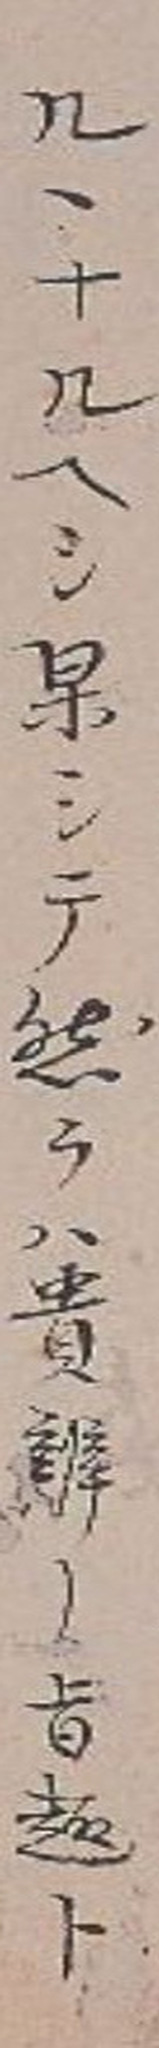ルヽナルヘシ果シテ然ラハ貴弁ノ旨趣ト
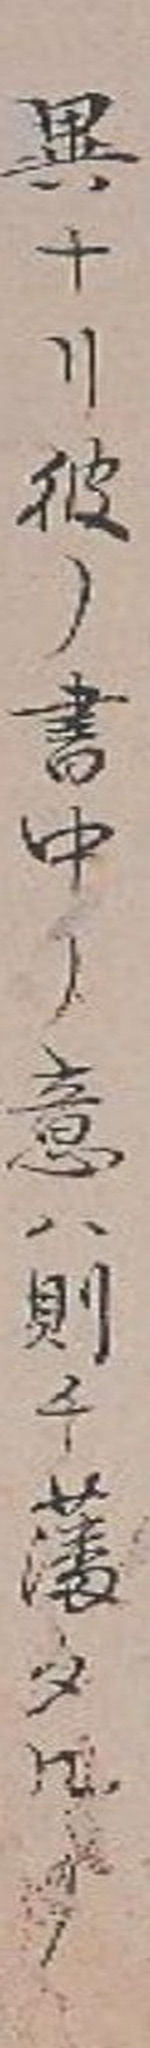異ナリ彼ノ書中ノ意ハ則チ藩タルノ
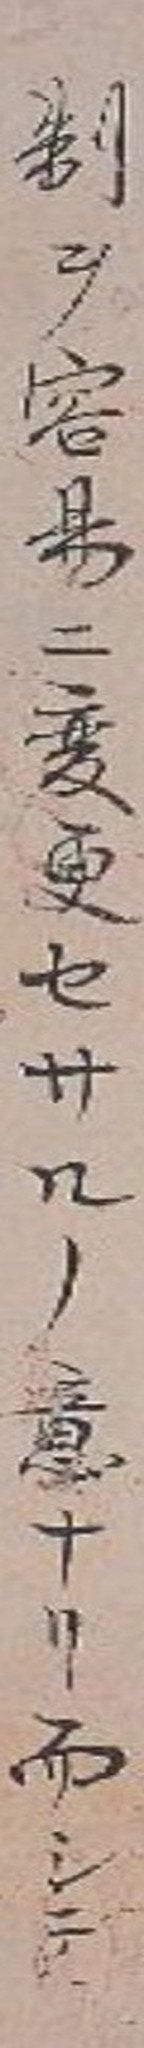制ヲ容易ニ変更セサルノ意ナリ而シテ
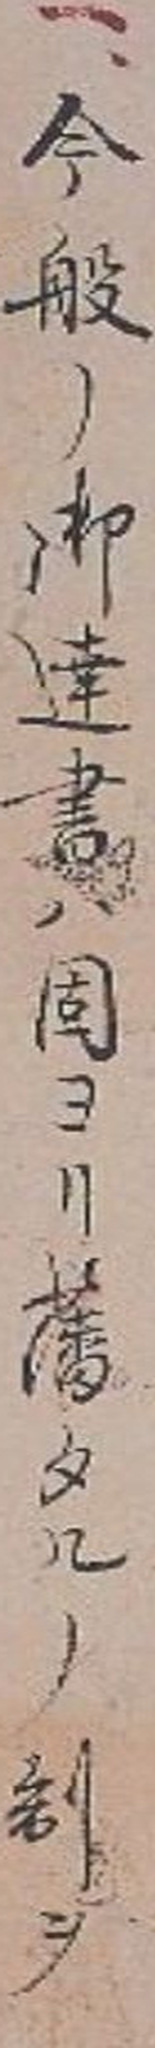一、今般ノ御達書ハ固ヨリ藩タルノ制ヲ
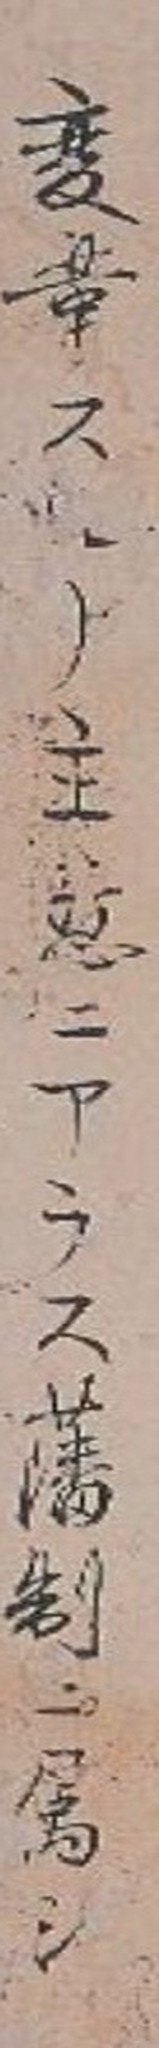変革スルノ主意ニアラス藩制ニ属シ

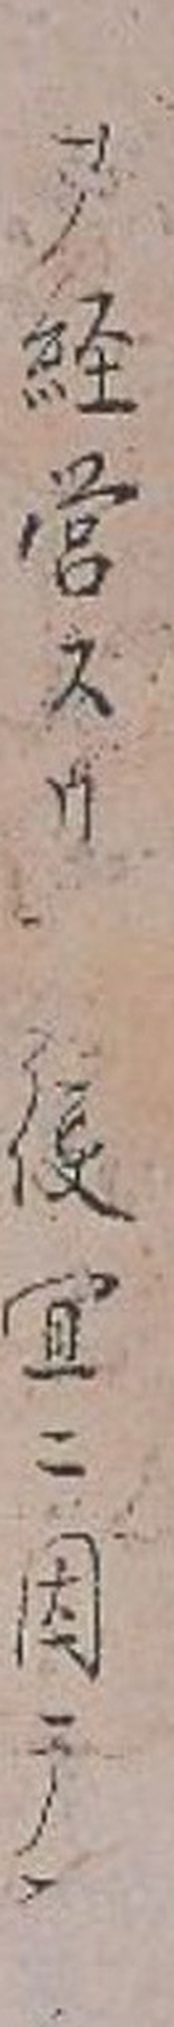ヲ経営スル便宜ニ因テ
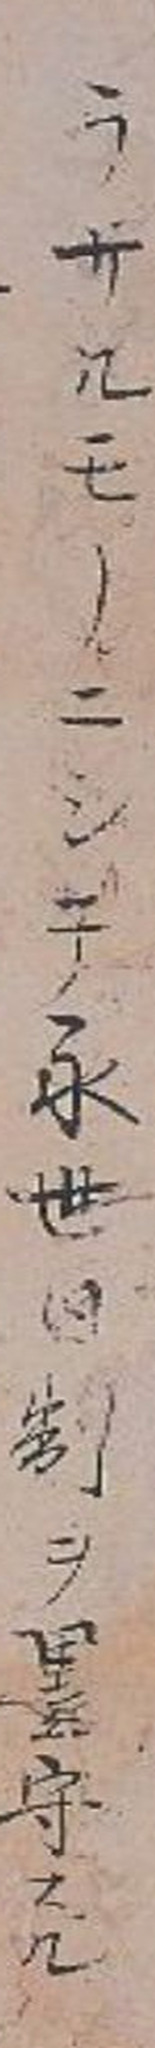ラサルモノニシテ永世日制ヲ墨守スル
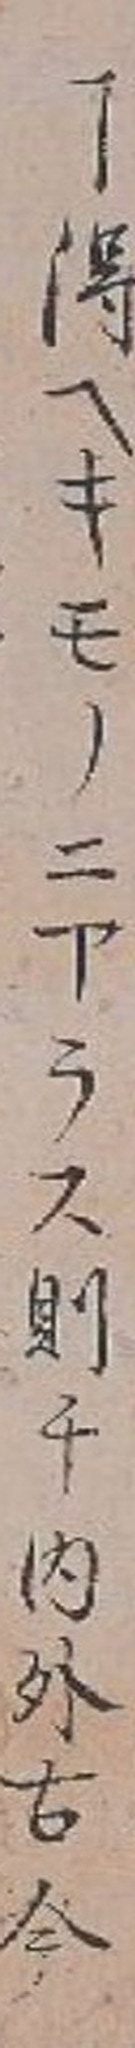コト得ヘキモノニアラス則チ内外古今
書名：奉使琉球始末 草稿之一部
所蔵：University of the Ryukyus Library
